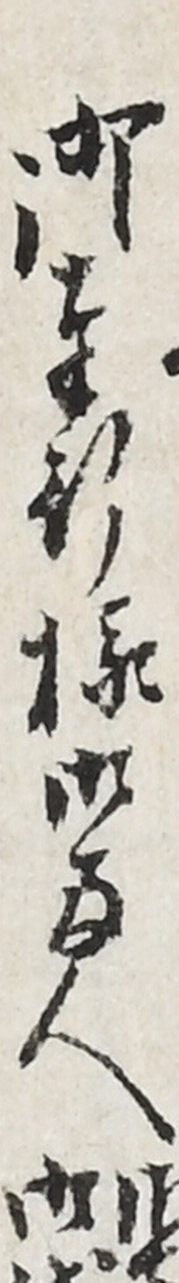御奉行様御壱人
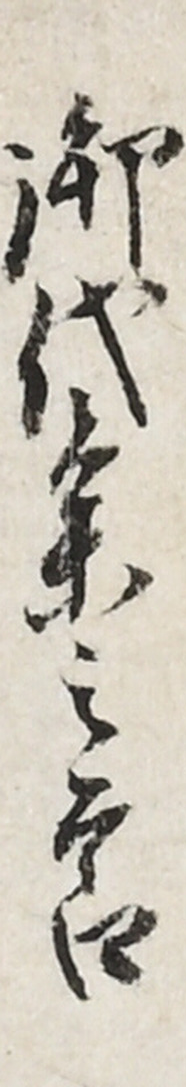御代参之節
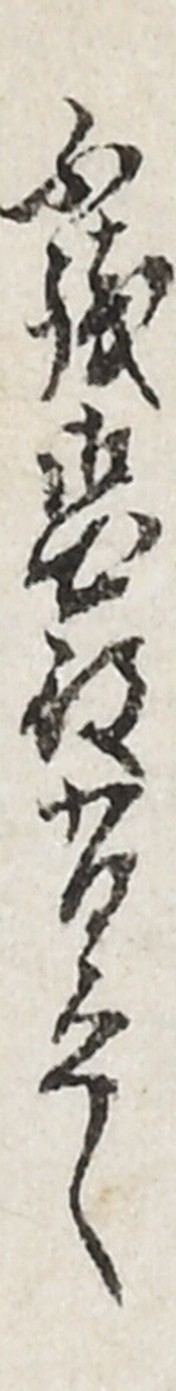不残御出役有之候
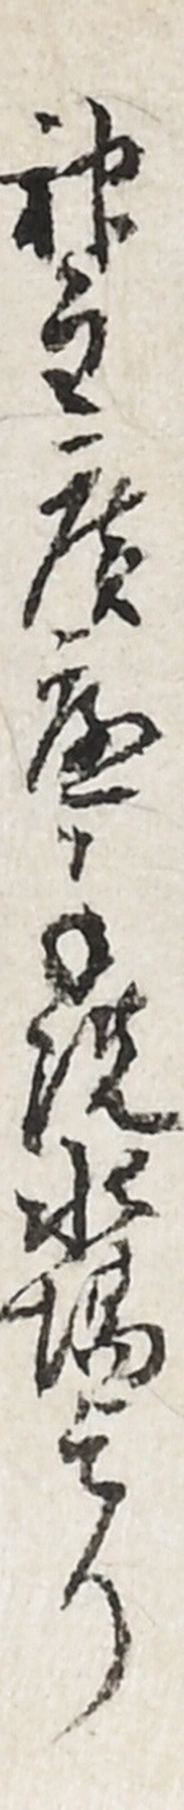神主広庭手洗水場より
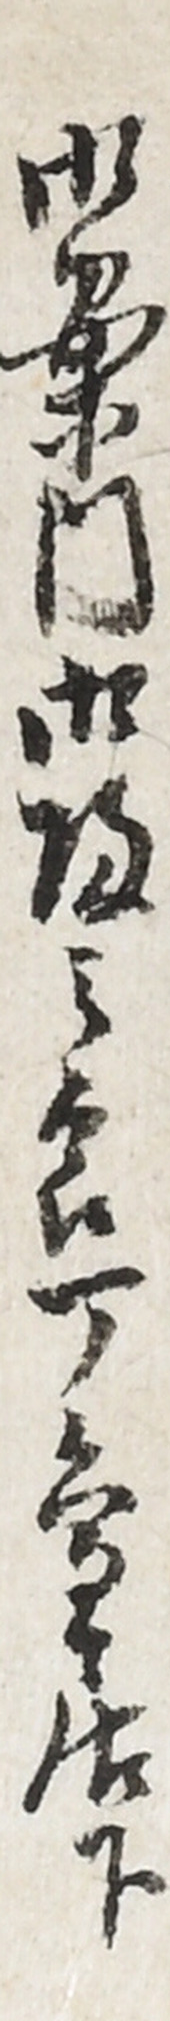御案内御帰之節一ノ鳥居下
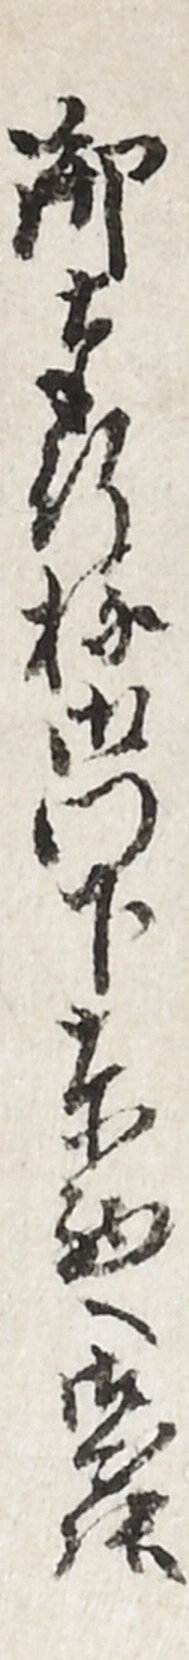御奉行様御門下東西へ御出張
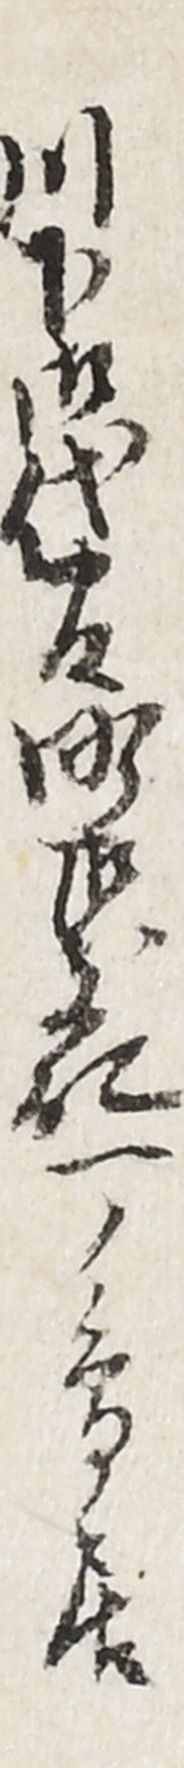川下御代官町御支配一ノ鳥居
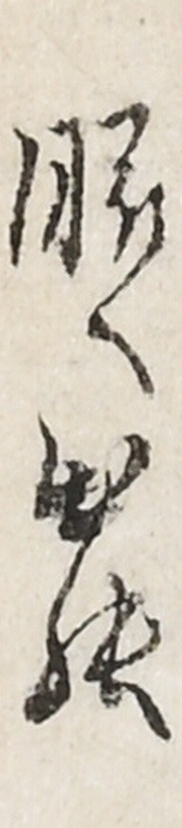脇へ出帳
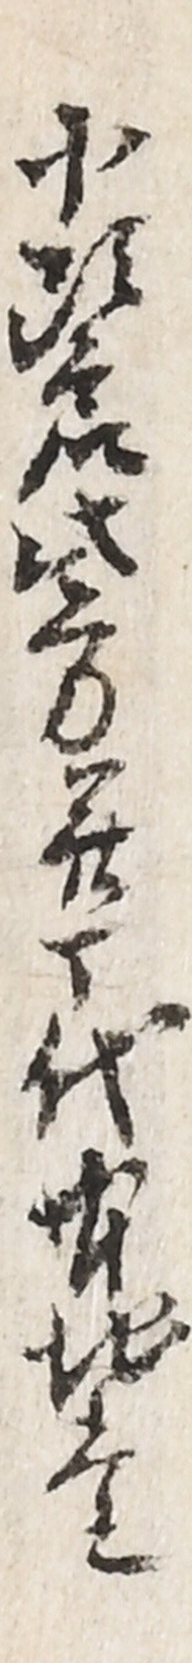小頭衆此方并丁代官地金
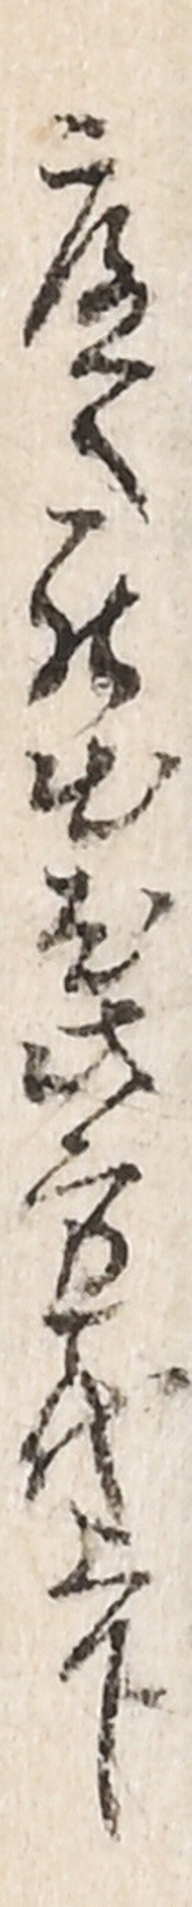庭へ罷出尤此方代上下
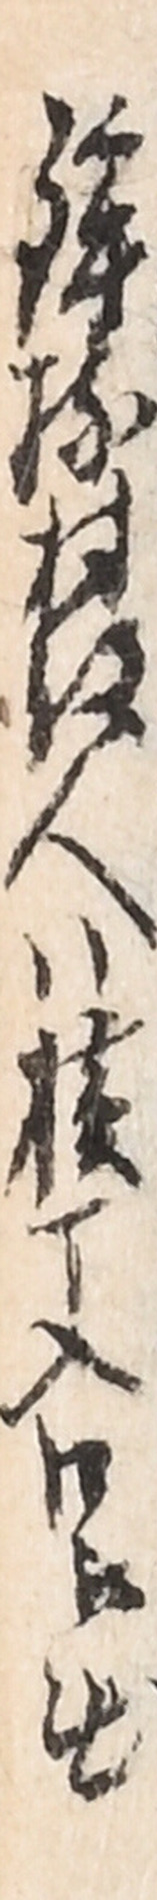鉾持役人ハ横丁入口江出

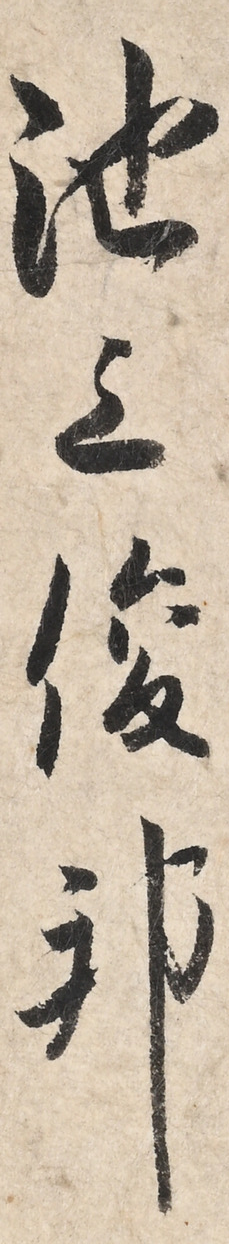池上俊邦
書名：年内行事懐中録
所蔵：伊那市立高遠町図書館・合同会社AMANE
